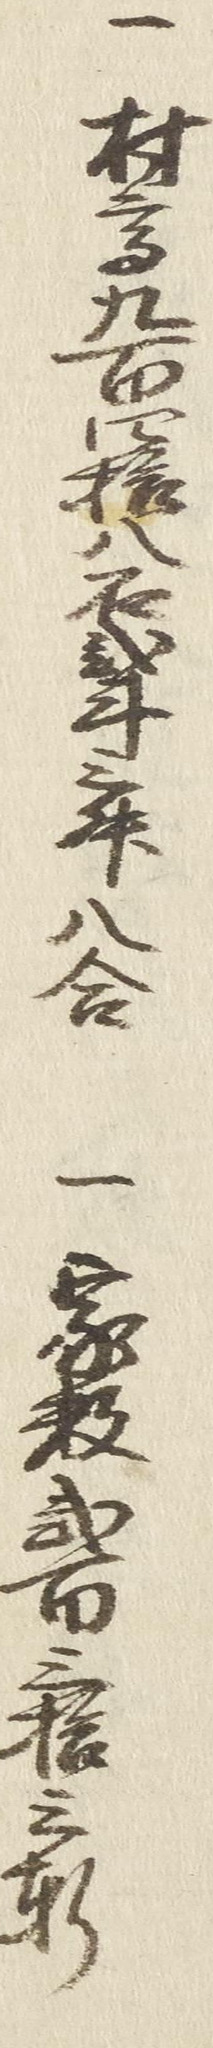一村高九百四拾八石弐斗三升八合一家数弐百三拾三軒
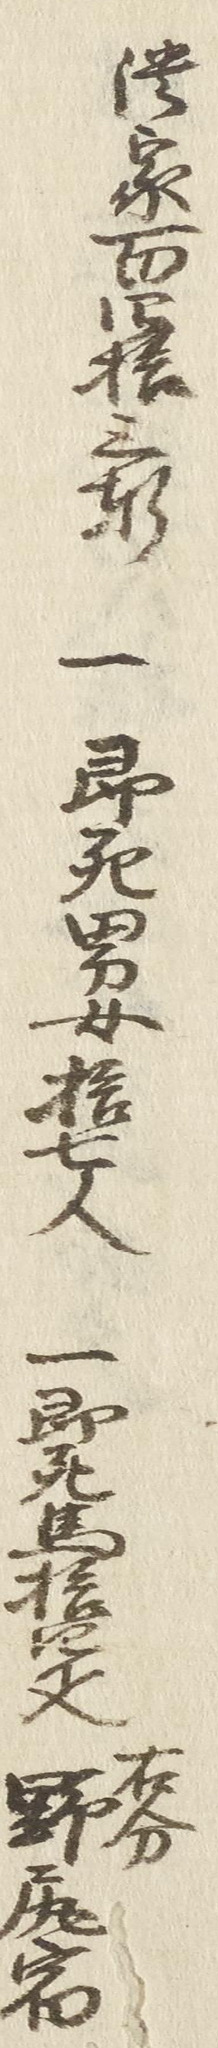一潰家百四拾三軒一即死男女拾七人一即死馬拾四疋右分野尻宿
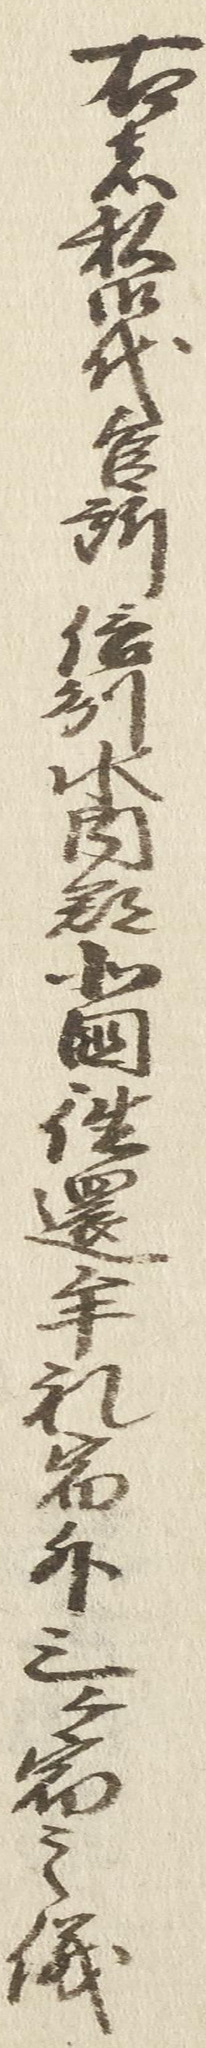右は私御代官所信州水内郡北国往還牟礼宿外三ヶ宿之儀
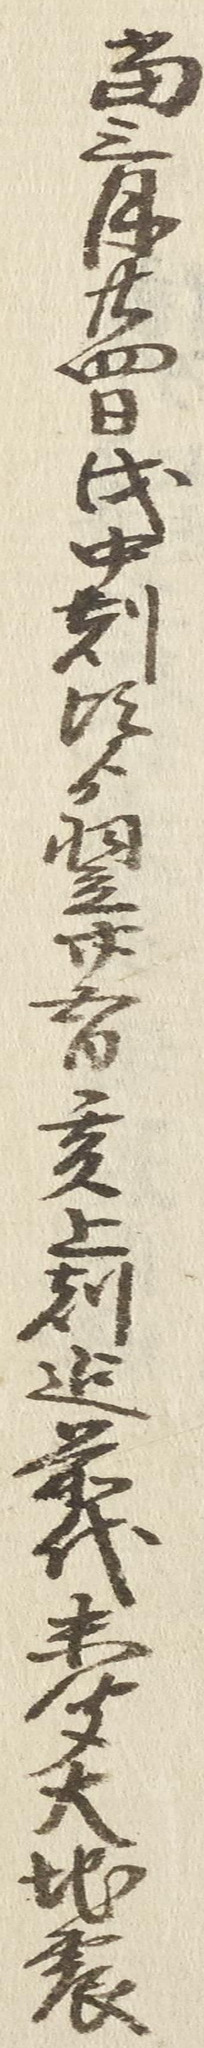当三月廿四日戌中刻頃ゟ翌廿五日亥上刻迄前代未聞大地震
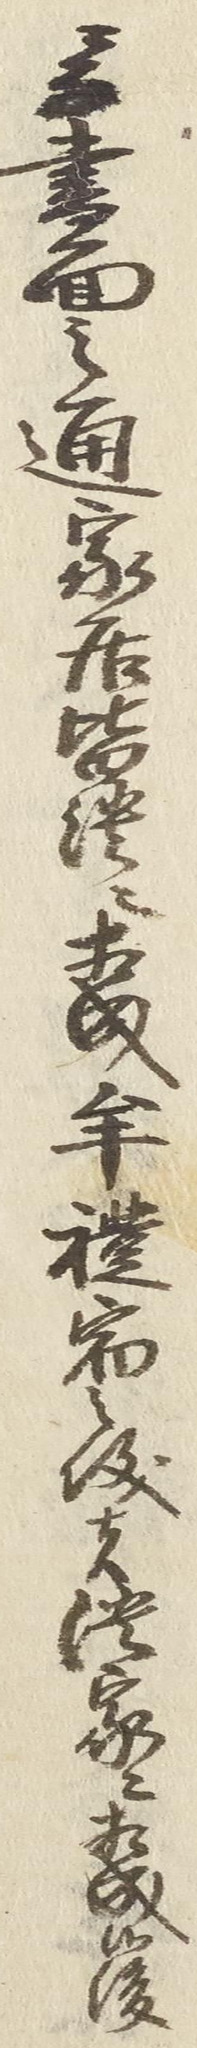二而書面之通家居皆潰二相成牟礼宿之儀は潰家二相成候後
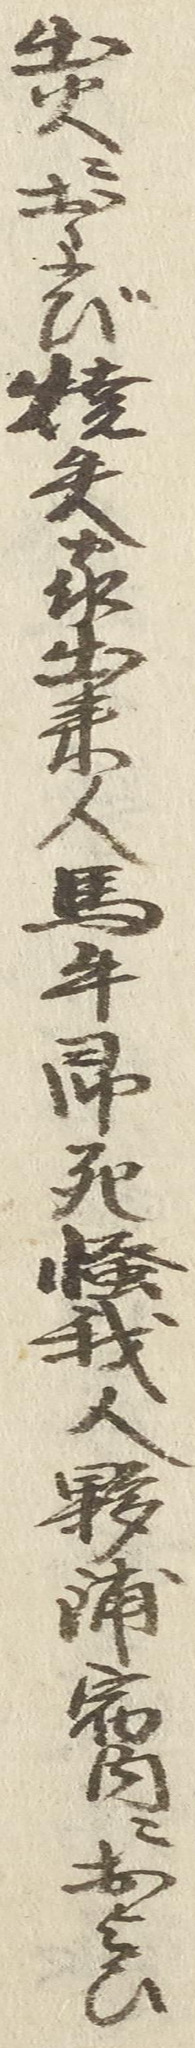出火二および焼失家出来人馬牛即死怪我人夥敷宿内二および
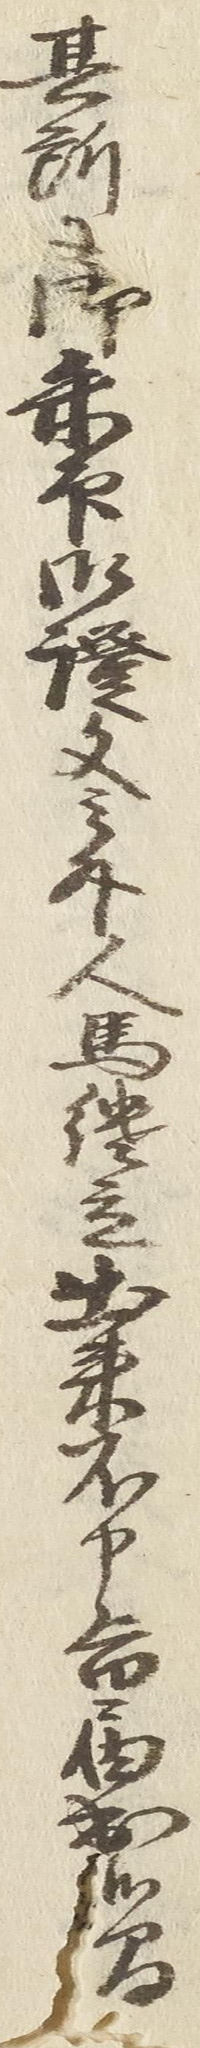其所も御朱印御證文之外人馬継立出来不申旨届出候間
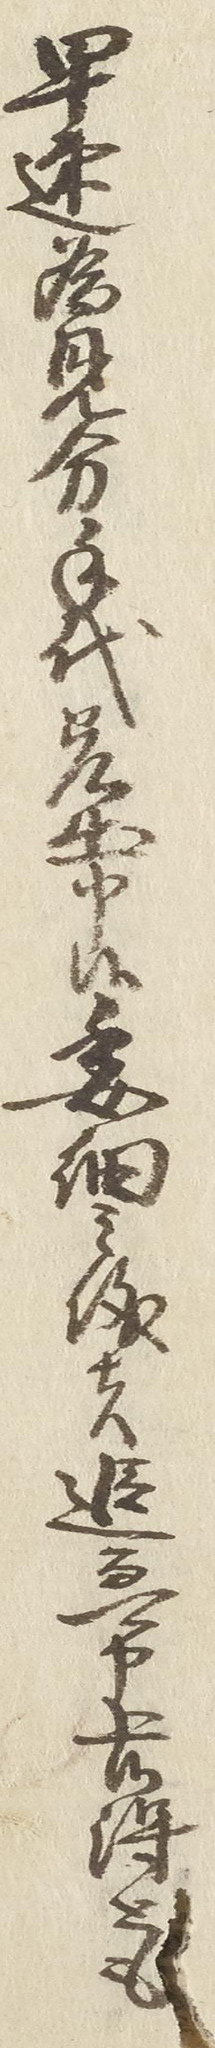早速為見分手代差出申候委細之儀は追而可申上侯得とも
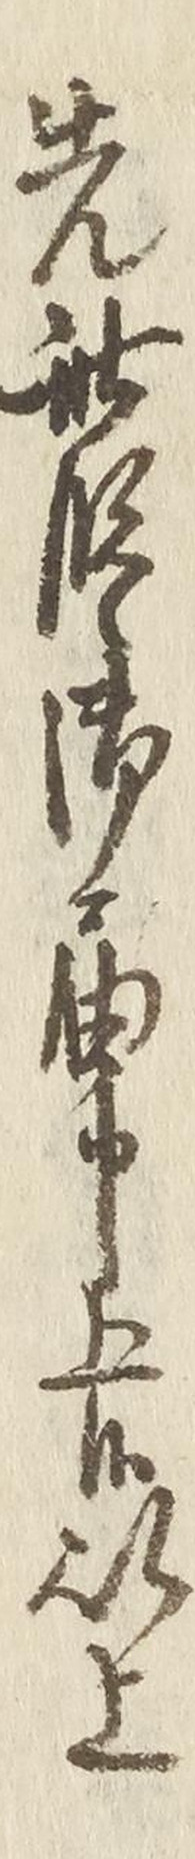先此段御届申上候以上
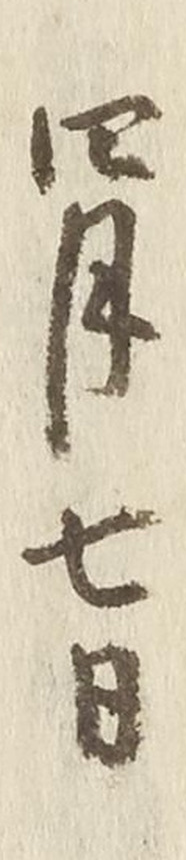四月七日
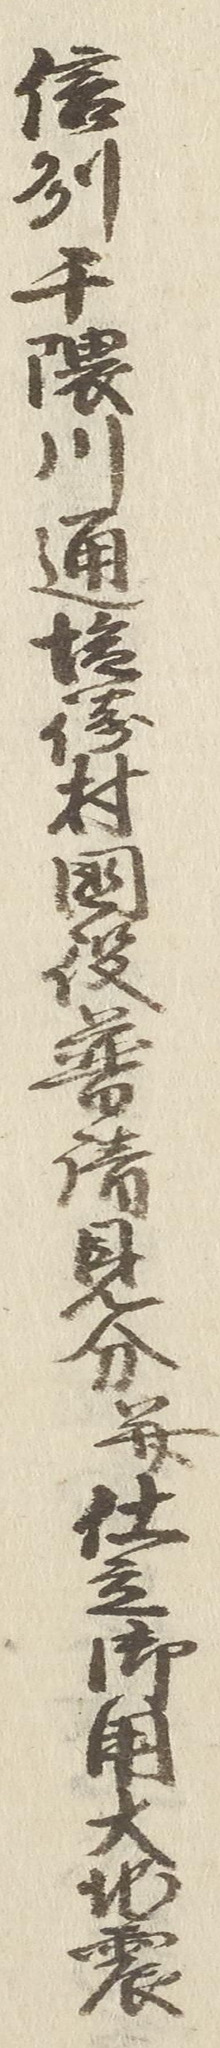信州千隈川通塩崎村国役普請見分并仕立御用大地震
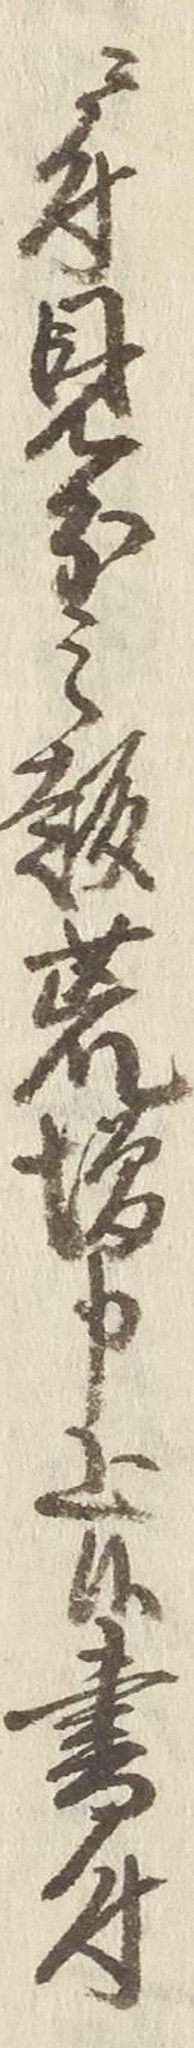二付見分之趣荒増申上候書付
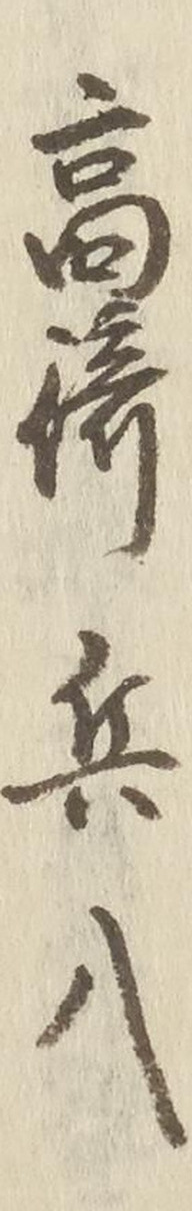高崎兵八
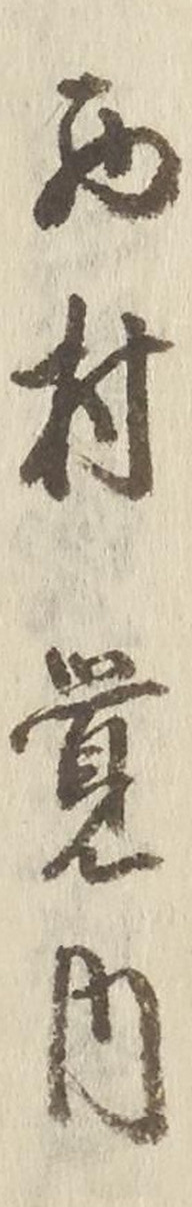西村覚内

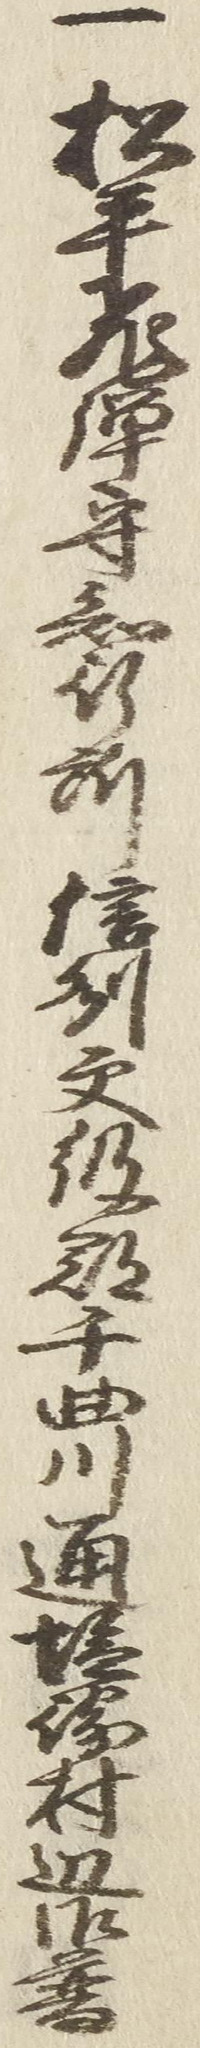一松平飛騨守知行所信州更級郡千曲川通塩崎村辺御普
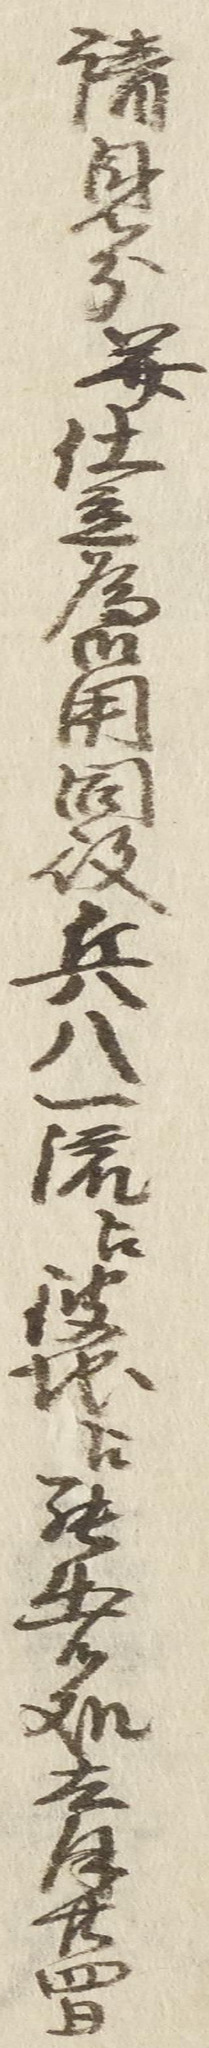請見分并仕立為御用同役高崎兵八一統江彼地江罷出候処去月廿四日
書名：従往古地震御届書記誌之一
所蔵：東京大学地震研究所図書室 Earthquake Research Institute Library, The University of Tokyo, JAPAN
